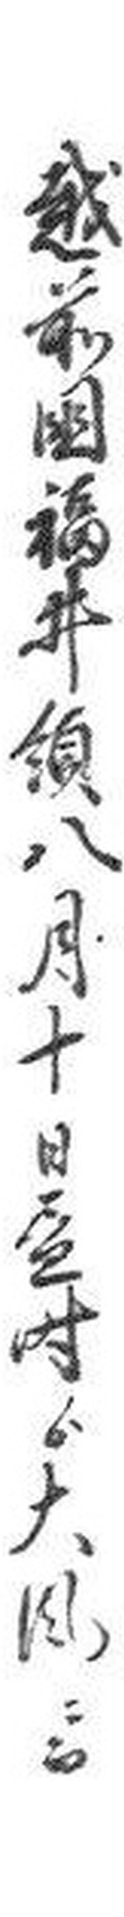越前国福井領八月十日昼時ゟ大風ニ而
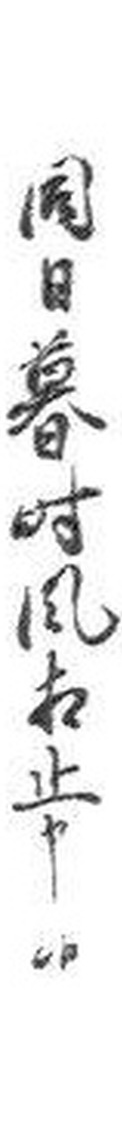同日暮時風相止申候
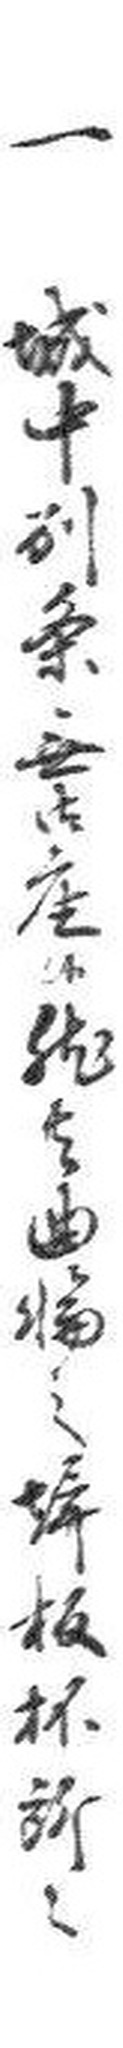一城中別条無御座候然者曲輪之塀板抔所々
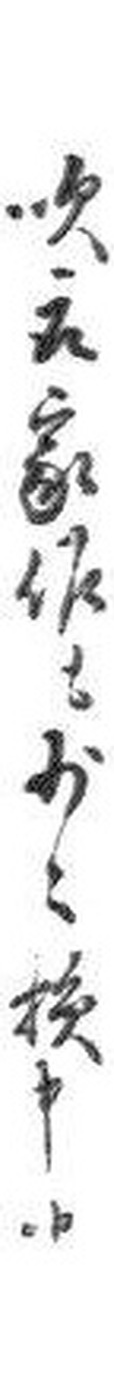吹取家作も少々損申候
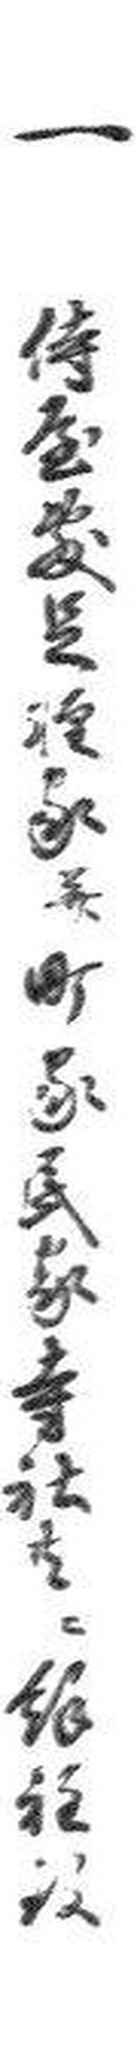一侍屋敷足軽家并町屋民家寺社共ニ余程致
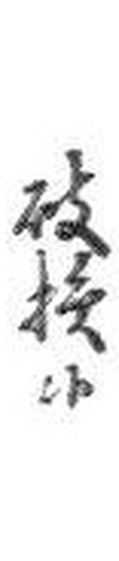破損候
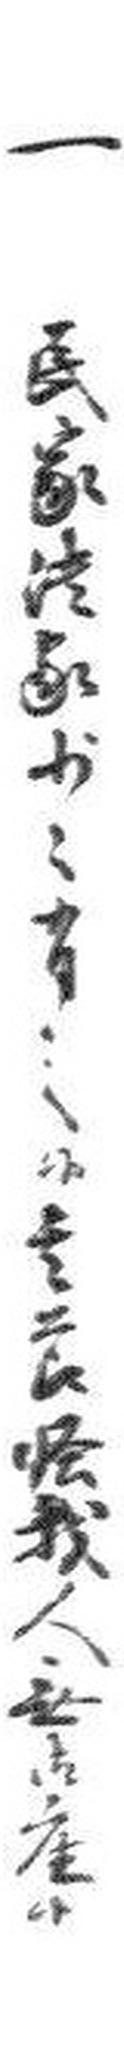一民家潰家少々有之候其節怪我人無御座候
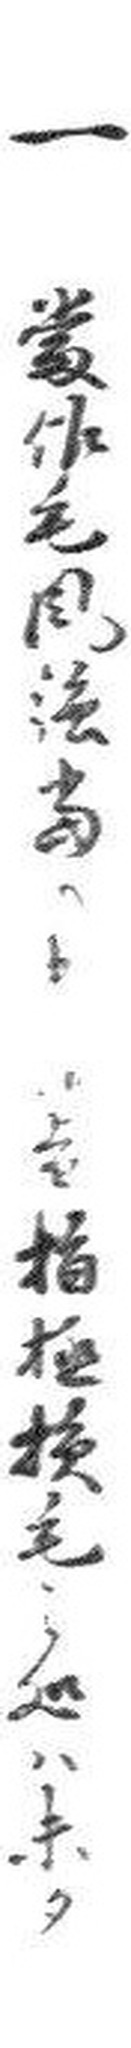当作毛風強南へ当り申候旨指極損毛之処ハ未タ
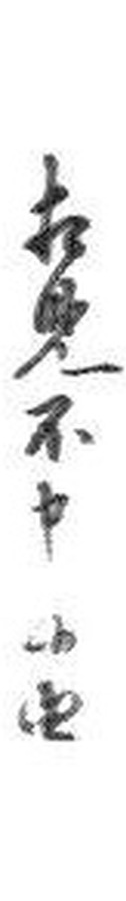相見不申候由
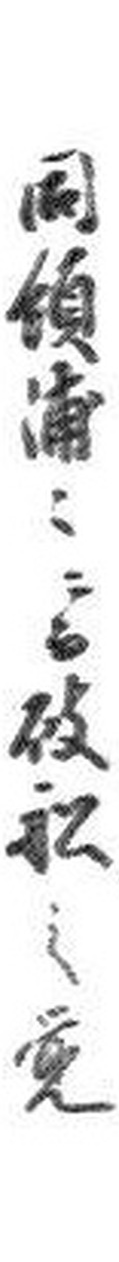同領浦々ニ而破船之覚
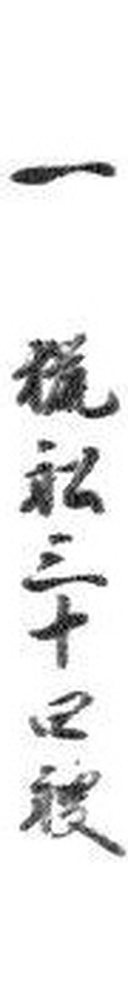一猟船三十四艘
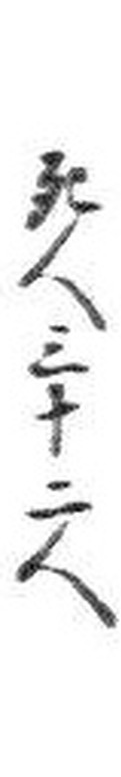死人三十二人
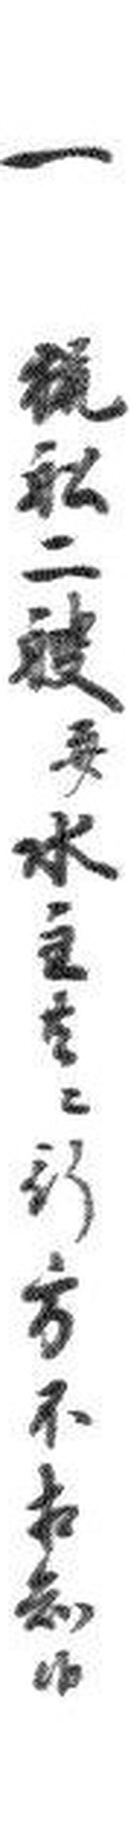一猟船二艘并水主共ニ行方不相知候

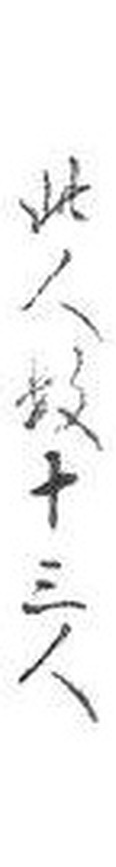此人数十三人
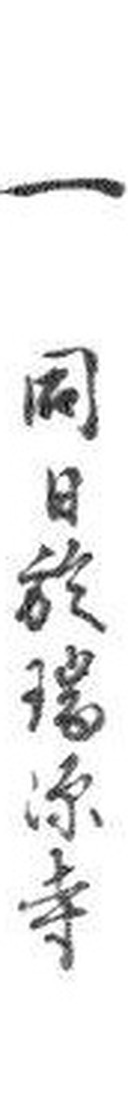一同日於瑞源寺
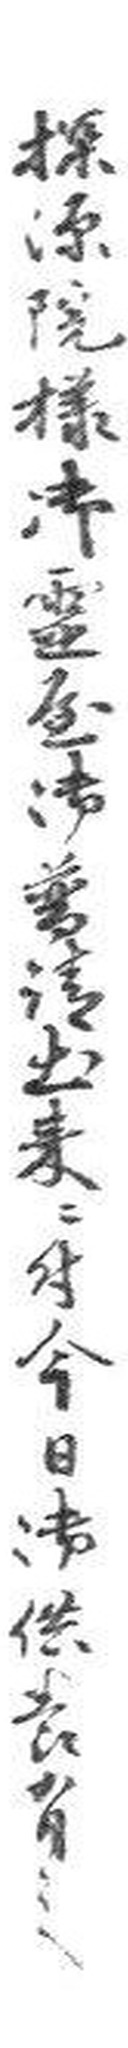探源院様御霊屋御普請出来ニ付今日御供養有之
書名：家譜 二十九 吉邦公 従正徳二年到正徳三年
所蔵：福井県文書館 Fukui Prefectural Archives
